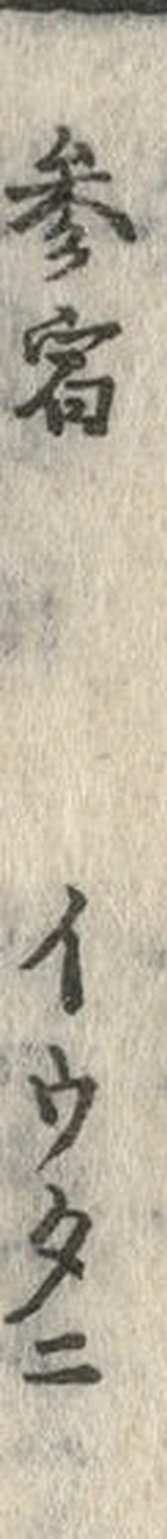参宿イウタニ
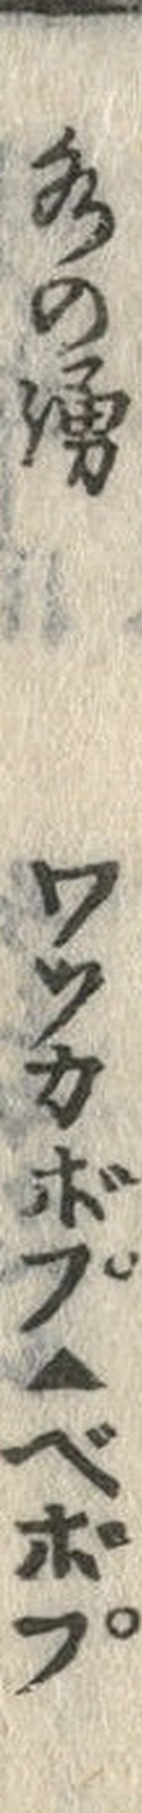水の湧ワツカボプ▲ベボプ
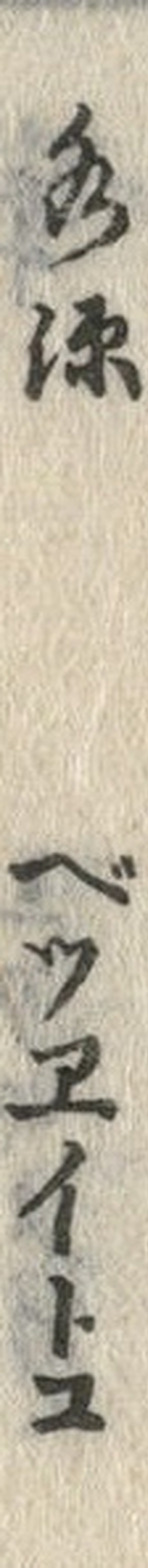水源ベツヱイトコ
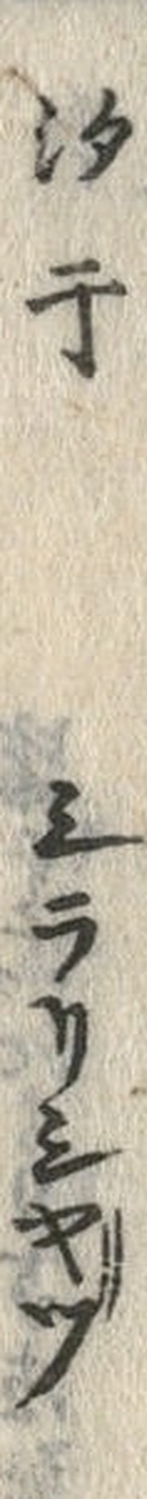汐干シラリシヤツ

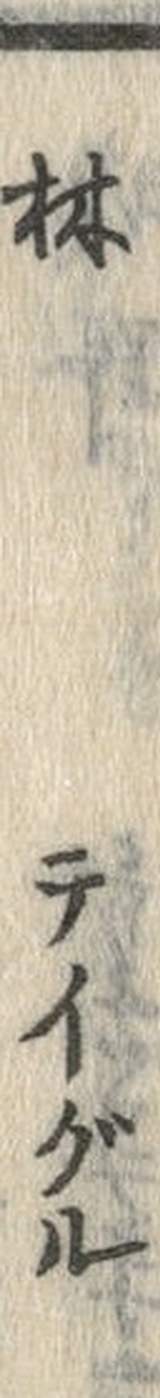林テイグル
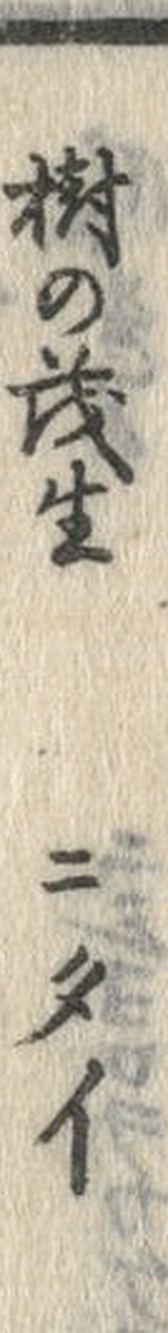樹の茂生ニタイ
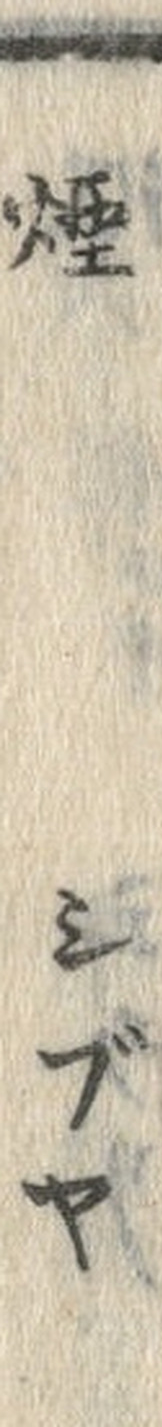煙シブヤ
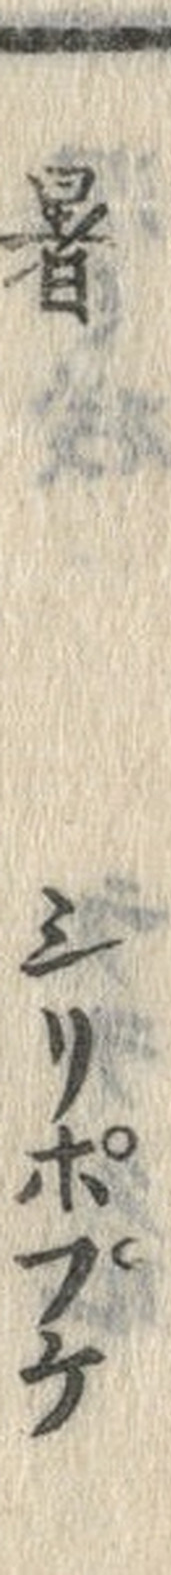暑シリポプケ

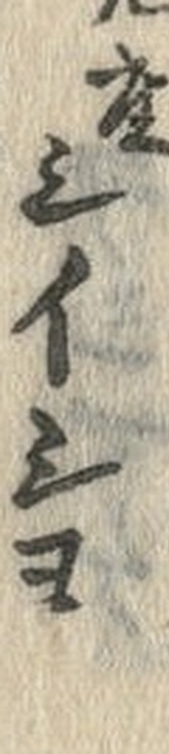シイシヨ
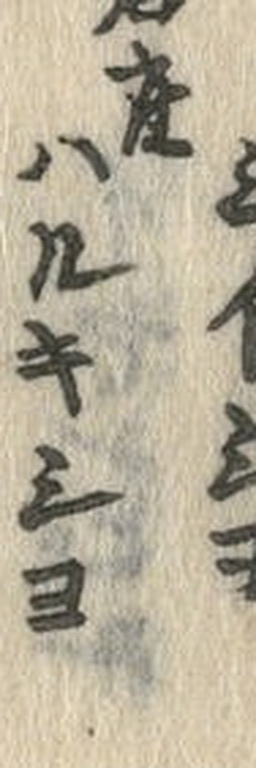ハルキシヨ
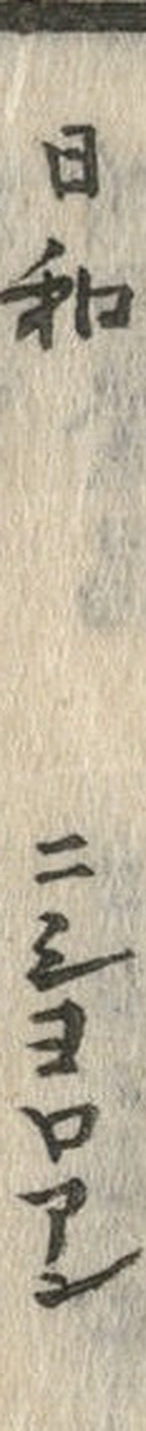日和ニシヨロアン
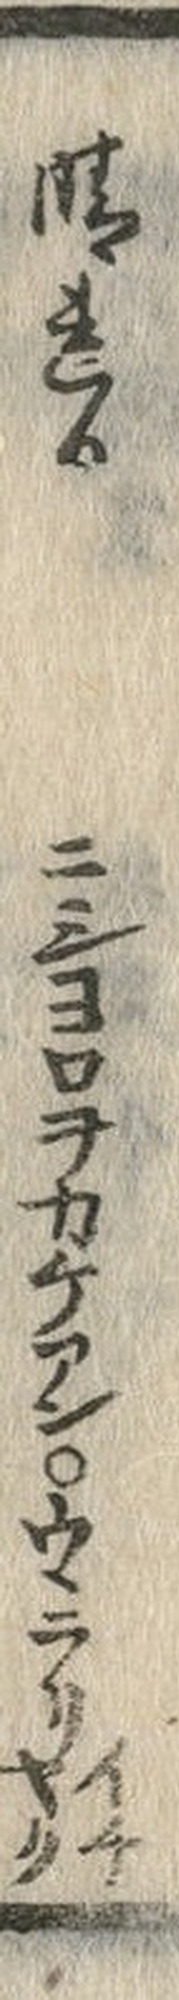晴れ日ニシヨロヲカケアン◯ウヽラリイチヤク
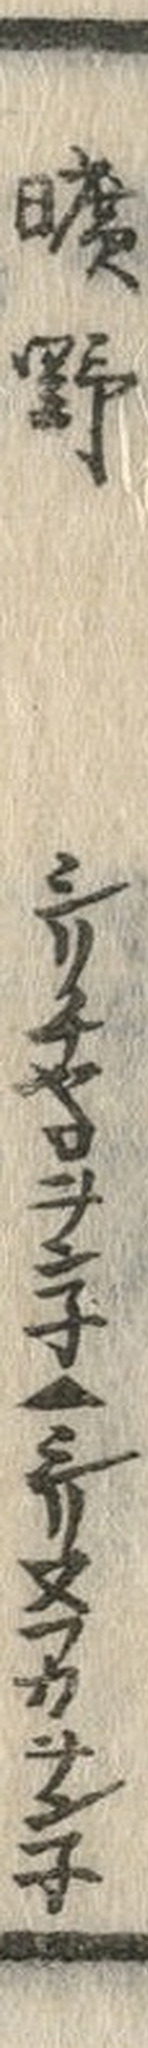曠野シリチヤロヲンネ▲シリヌフカヲンネ

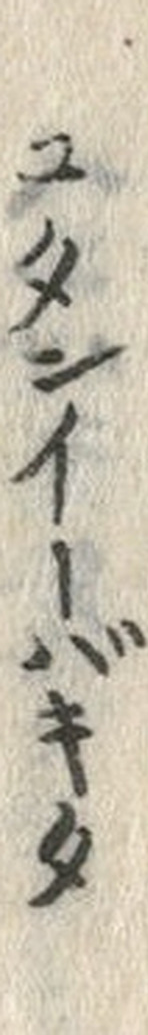郊コタンイーバキタ

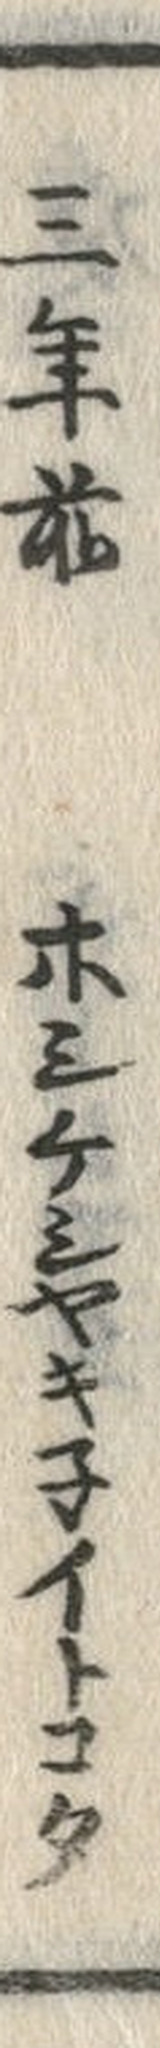三年前ホシケシヤキネイトコタ

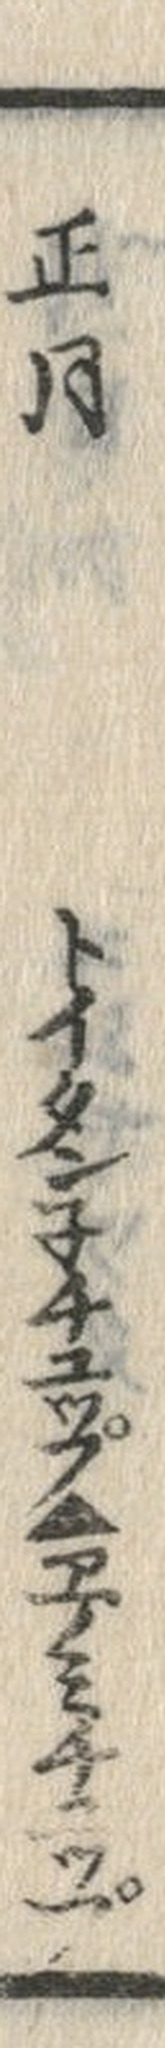正月トイタンネチユツプ▲ヱノミチユツプ
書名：蝦夷方言藻汐草　乾巻
